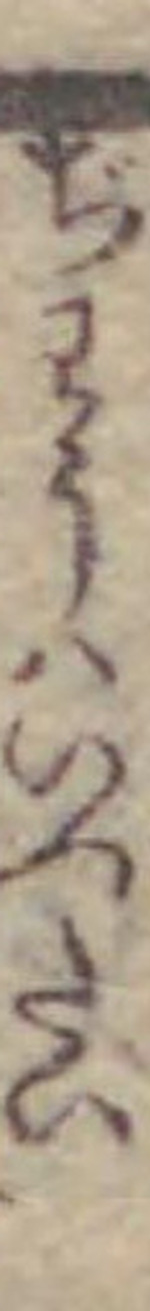ぢわうはいつたい
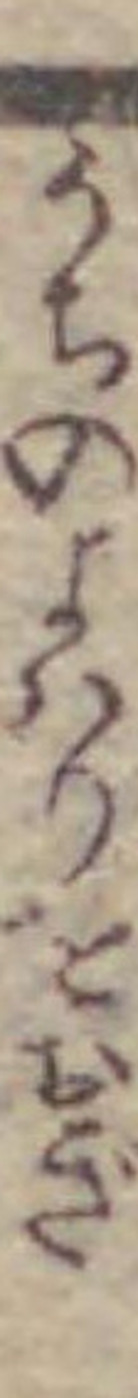うちのよはりをおぎ
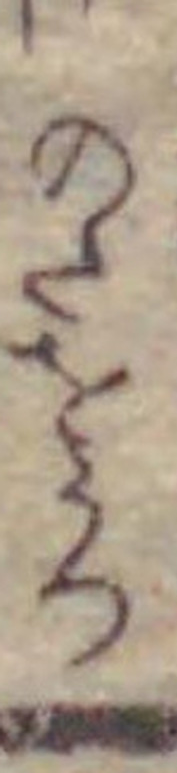のたをうつ
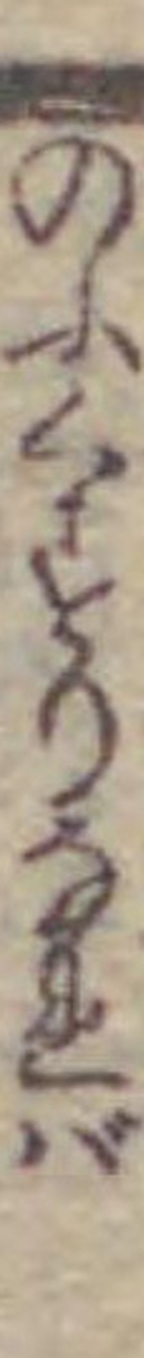のふくすりなれば
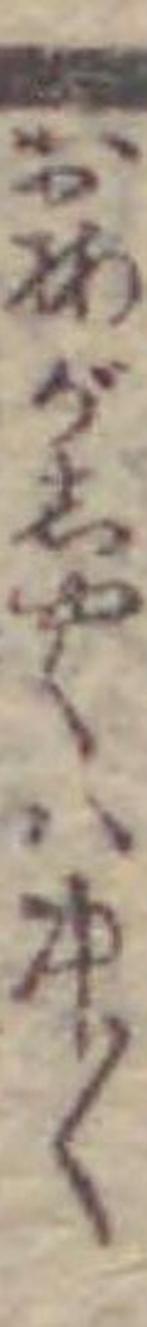お梅がしやくは中〳〵
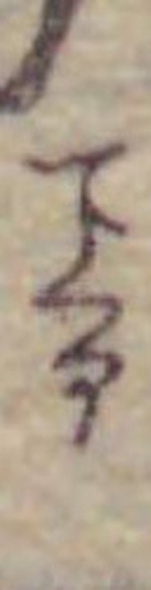てくる
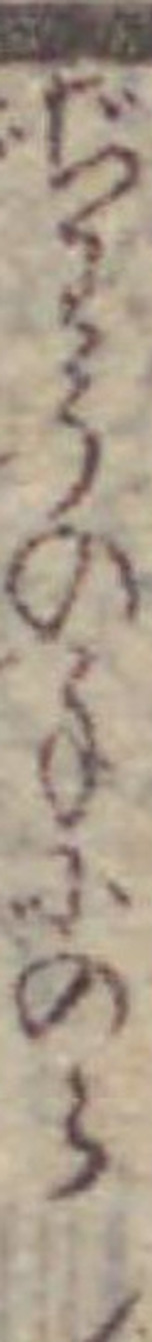ぢわうの手にのら
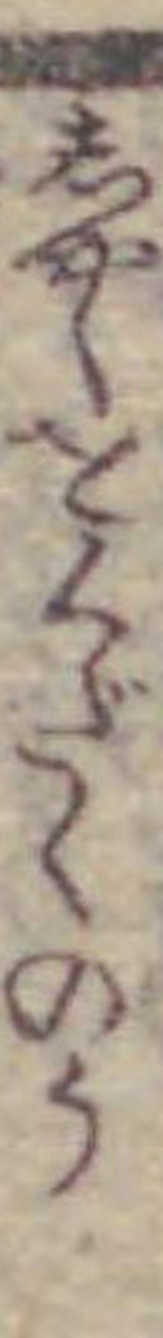しやくをくだくのう
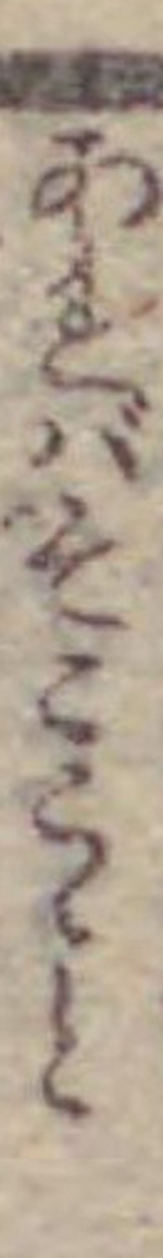あればそここゝと
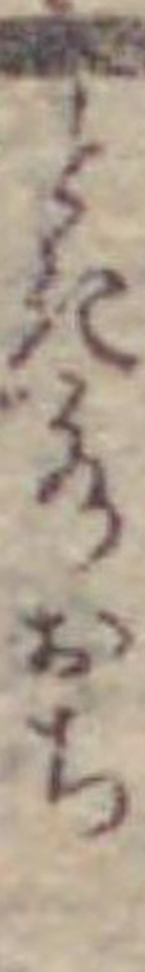とき水おち
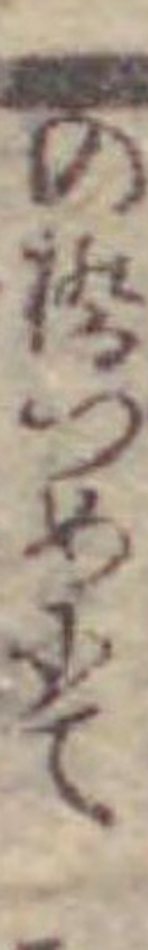の橋づめにて
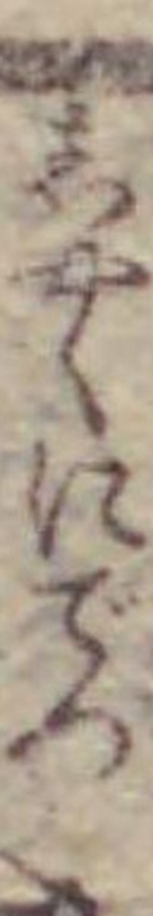しやくにでつ
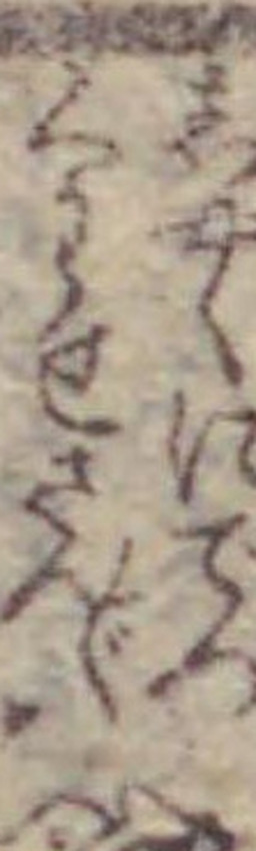くわせさん〴〵
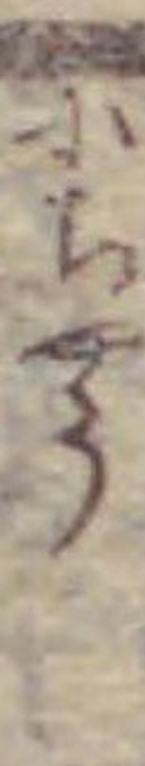にちやう
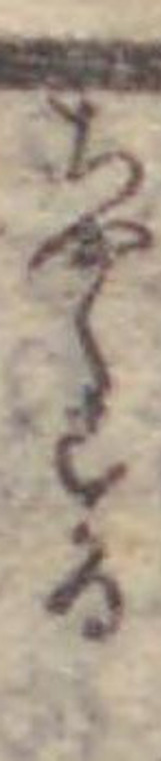ちやくする
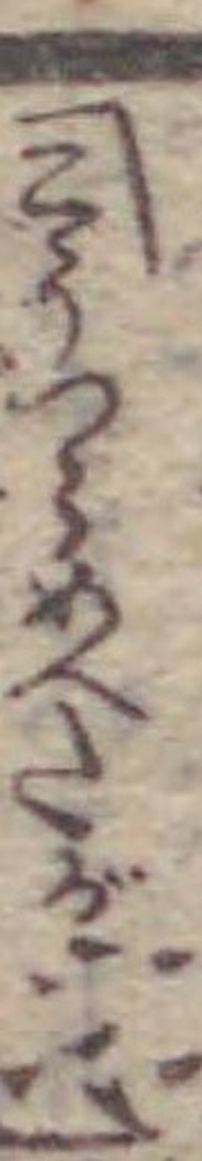〽こうつかめへたが
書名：鼻下長生薬 : 3巻
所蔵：国立国会図書館 National Diet Library, JAPAN
